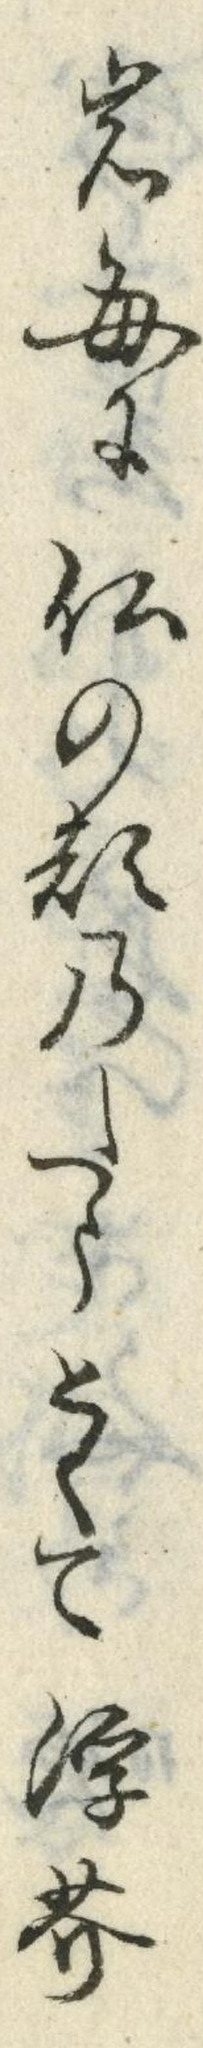岩毎に仏の顔のたうとくて浮芥
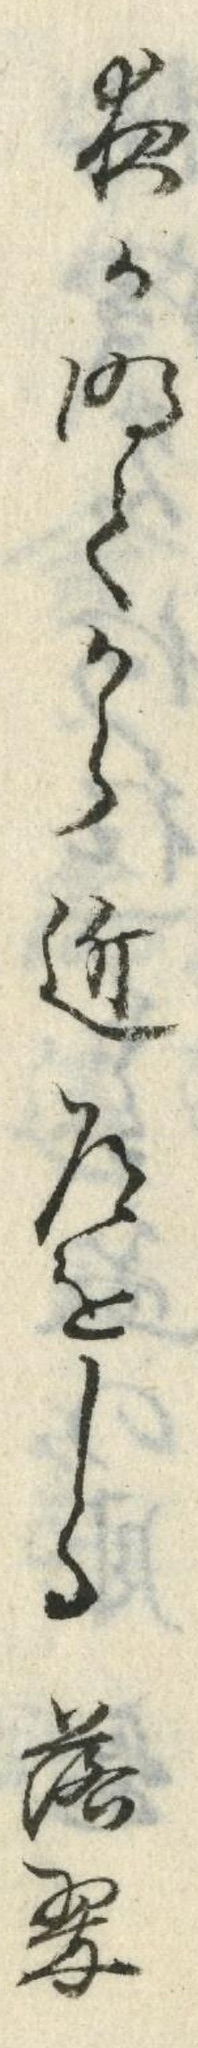夜か明てから近道をしる落翠
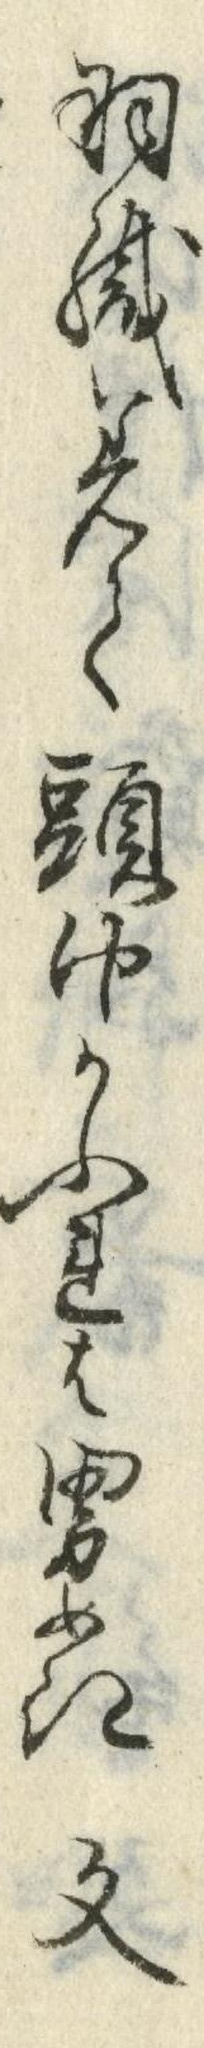羽織着て頭巾かふれは舅めき文
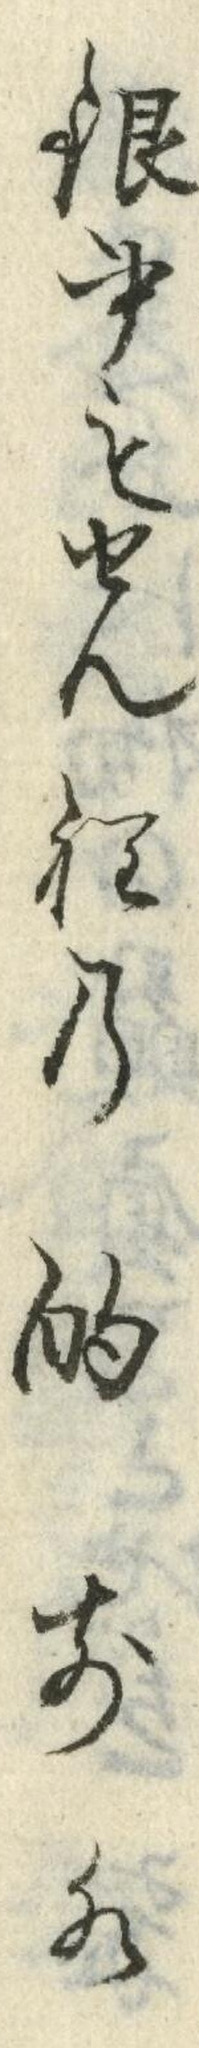銀書もせん程の的前水
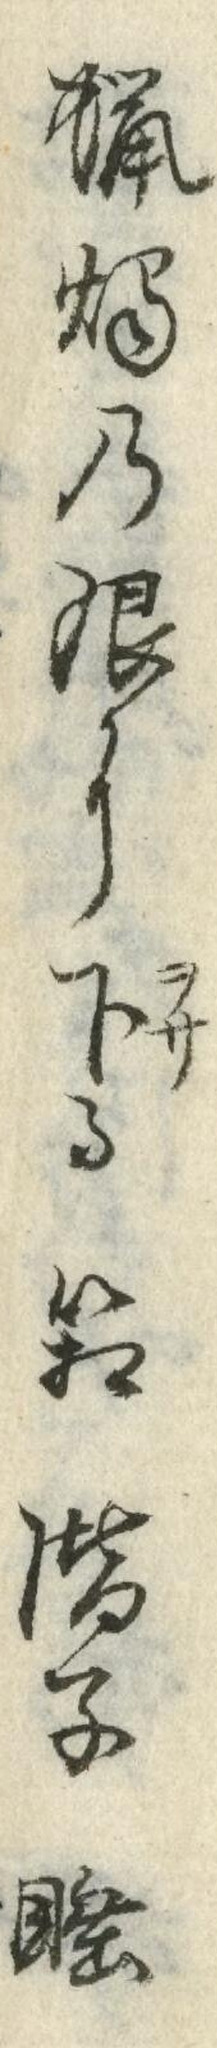蝋燭の限に下る箱階子睡

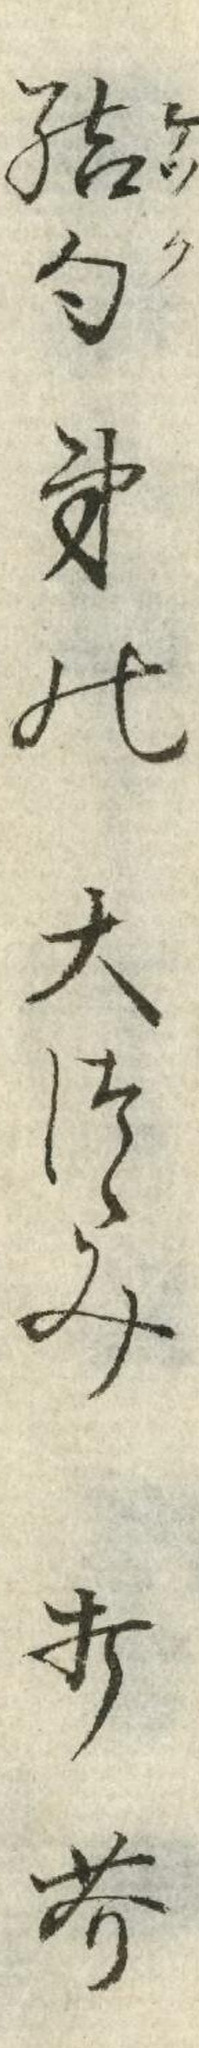結句第の大つゝみ打芥
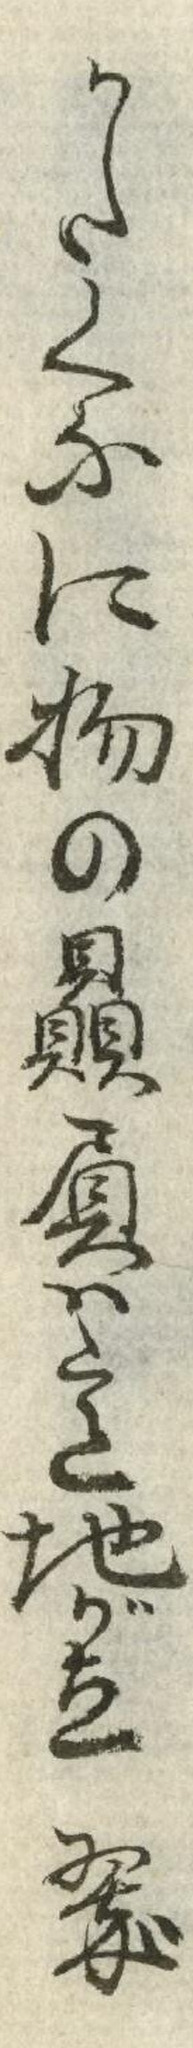かたくなに物の贔屓ハ意地が立翠
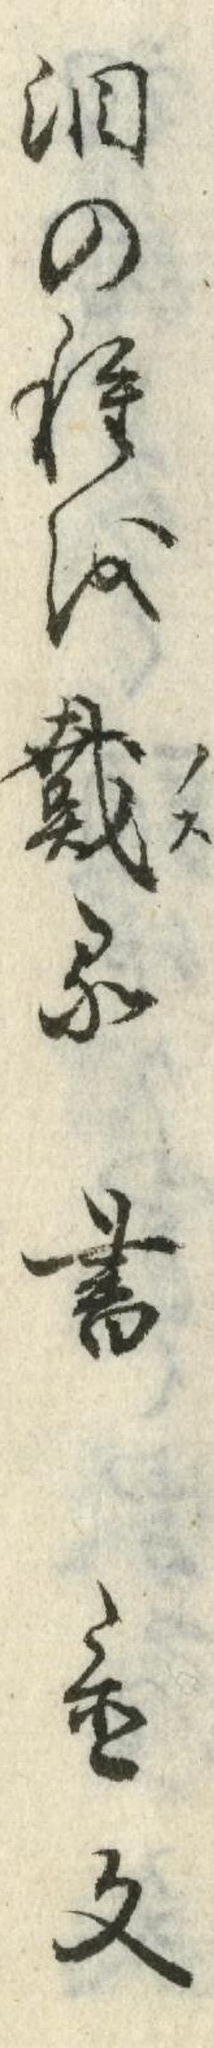泪の種を載る書置文
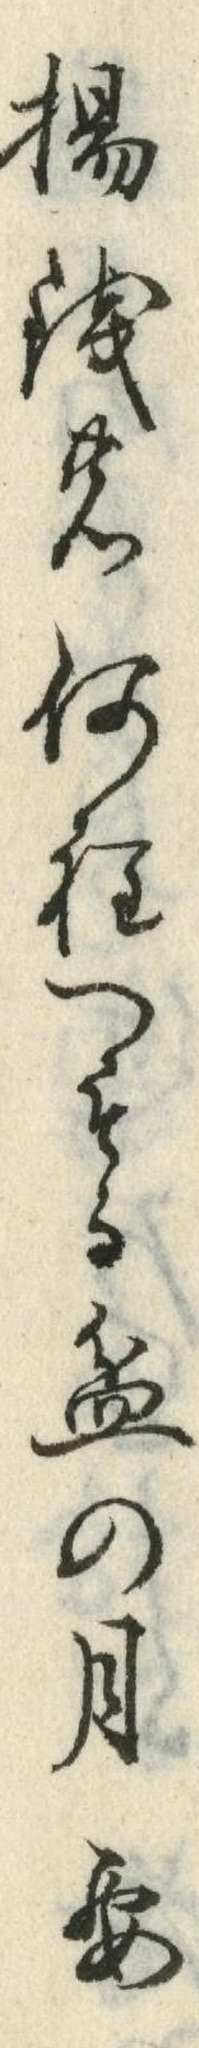揚銭の何程つもる盆の月要
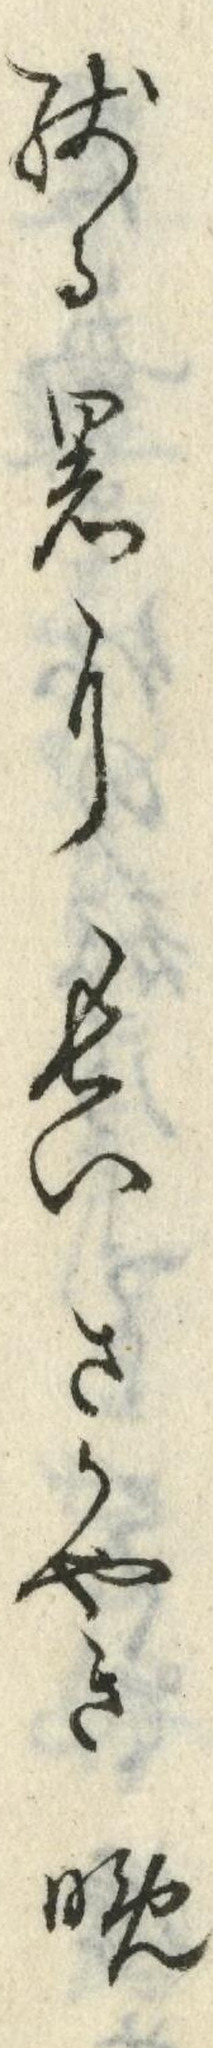残る暑に長いさかやき晩
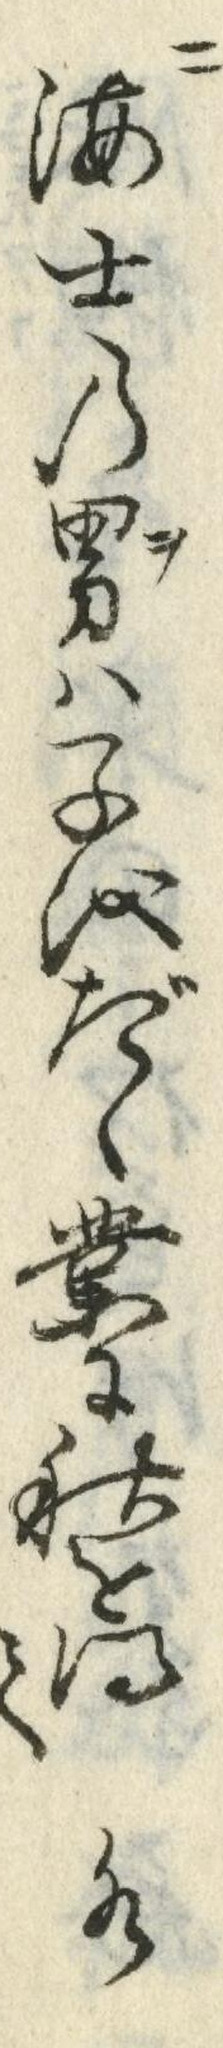海士の男は子をだく業に秋を得て水
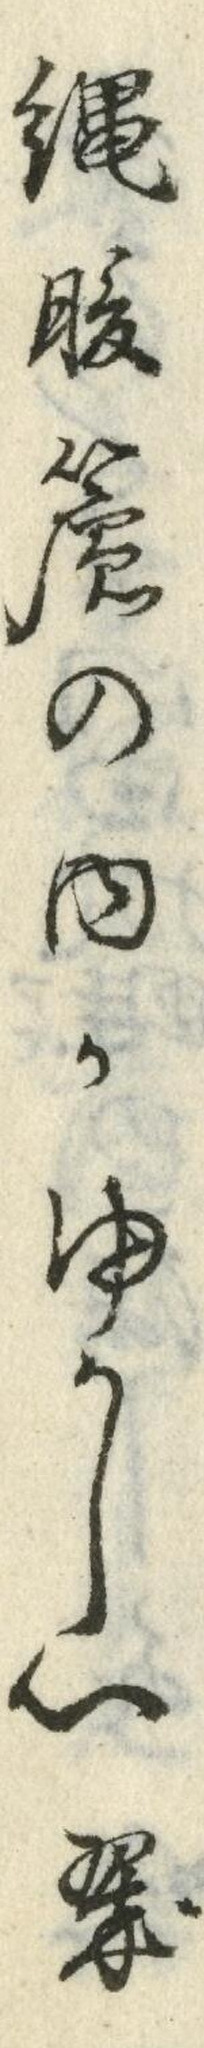縄暖簾の内かゆかしい翠
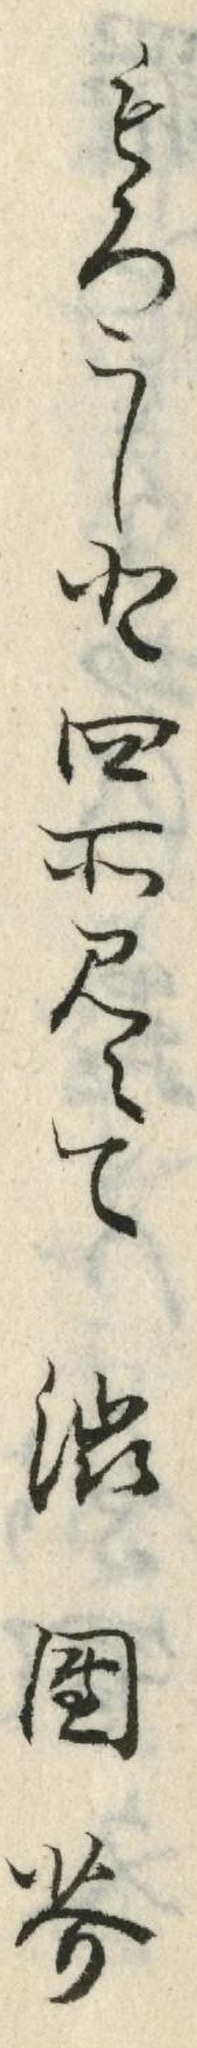もろこしと四所見ニて渋団芥
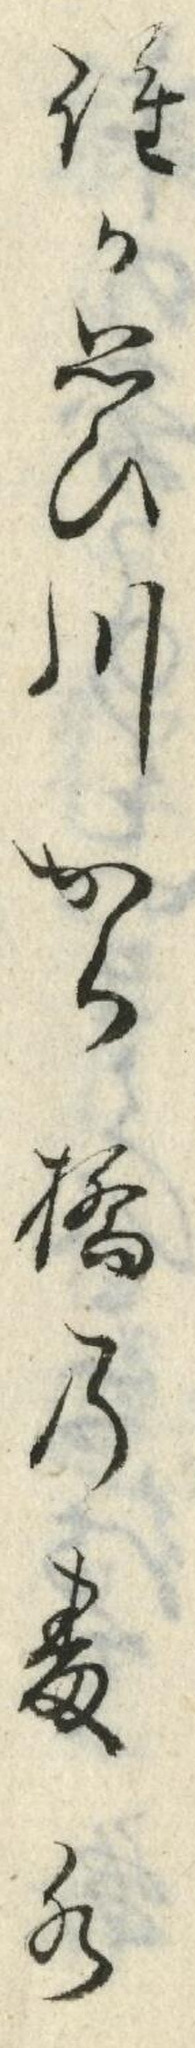誰か思ひ川から橋の番水
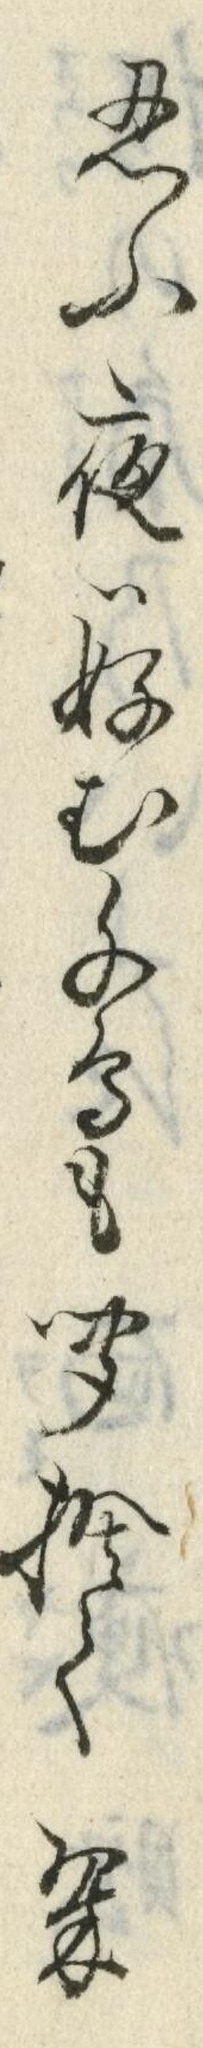忍ふ夜ハ好む千鳥も聞捨て翠
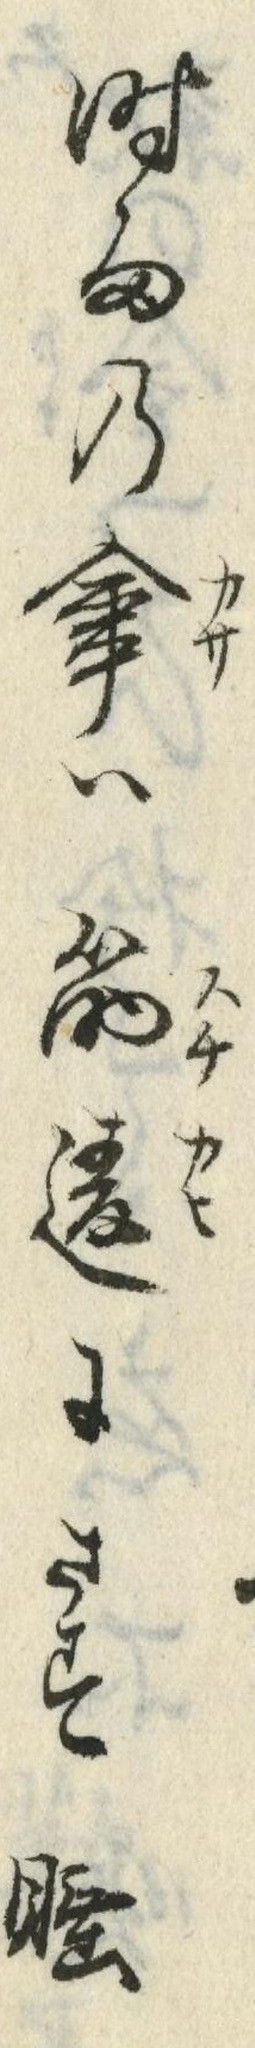時雨の傘ハ筋違にさす睡
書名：誹諧　能登釜
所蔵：Ishikawa Prefectural Library
